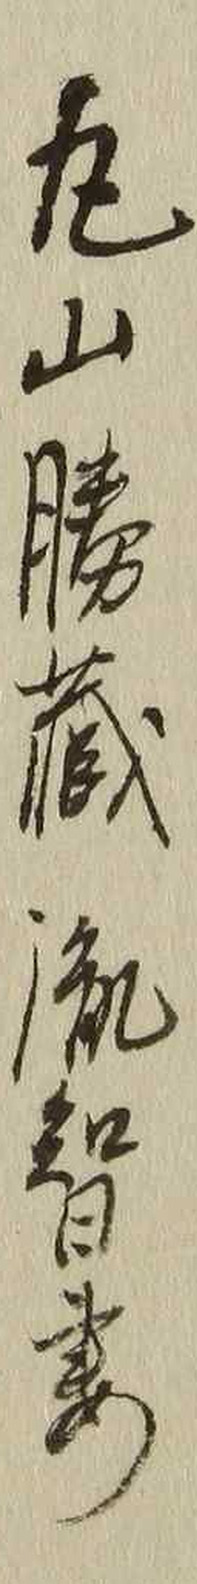女丸山勝蔵胤智妻
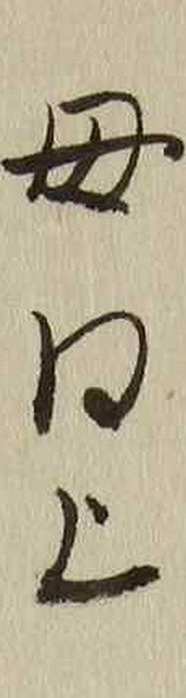母同上
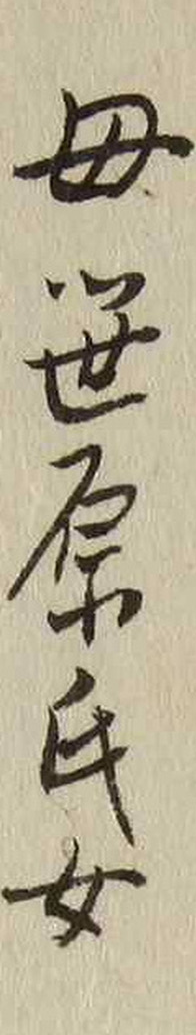母笹原氏女
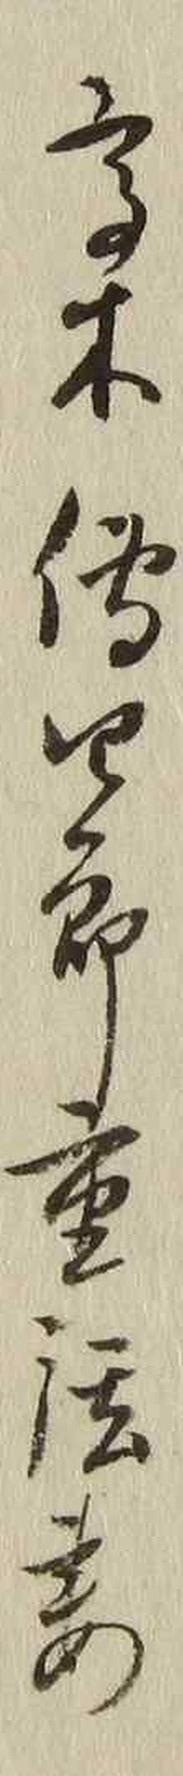女高木伝四郎重強妻
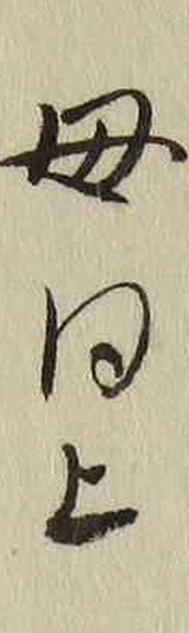母同上
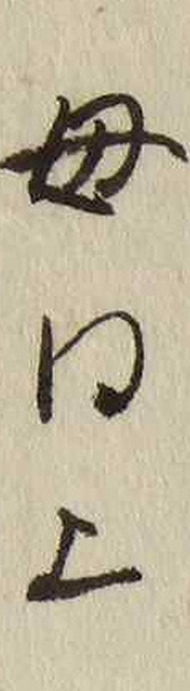母同上
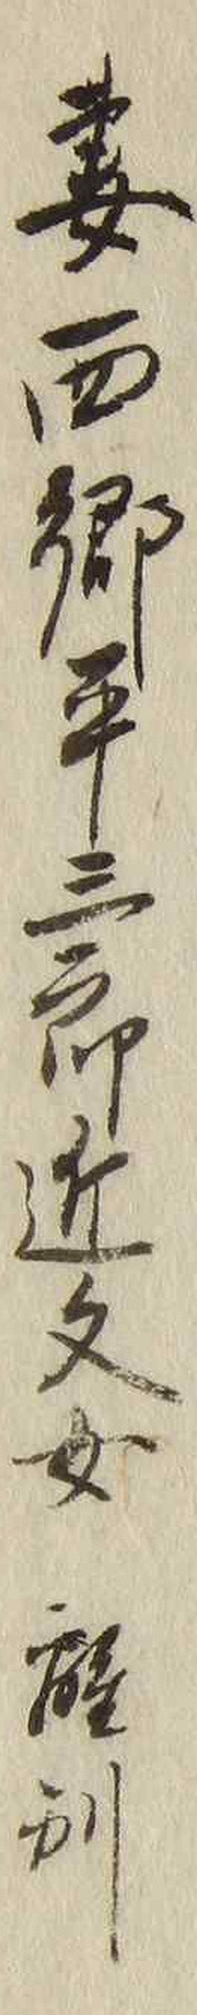妻西郷平三郎近文女離別

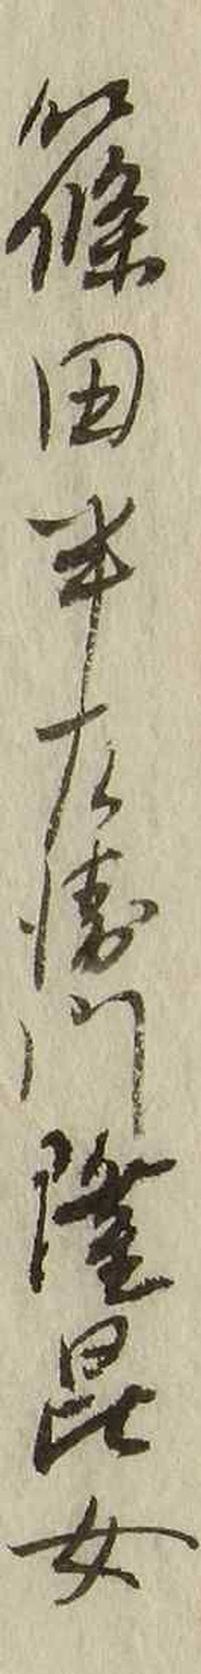篠田半左衛門隆昆女
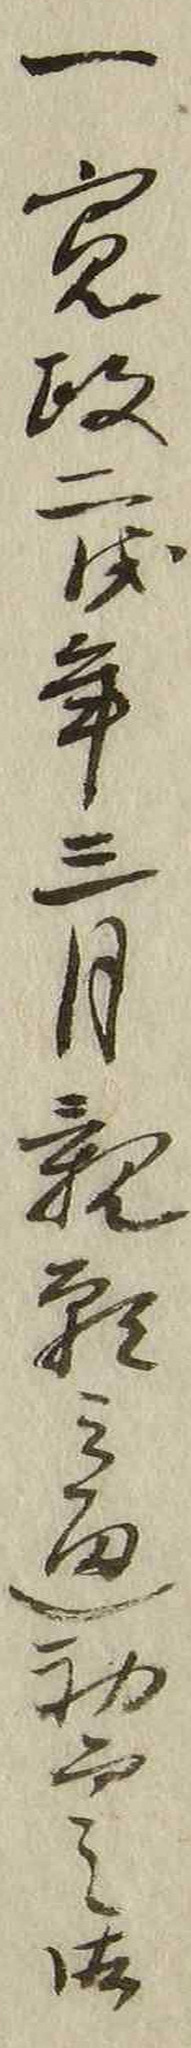一寛政二戌年三月親願之通初而之御
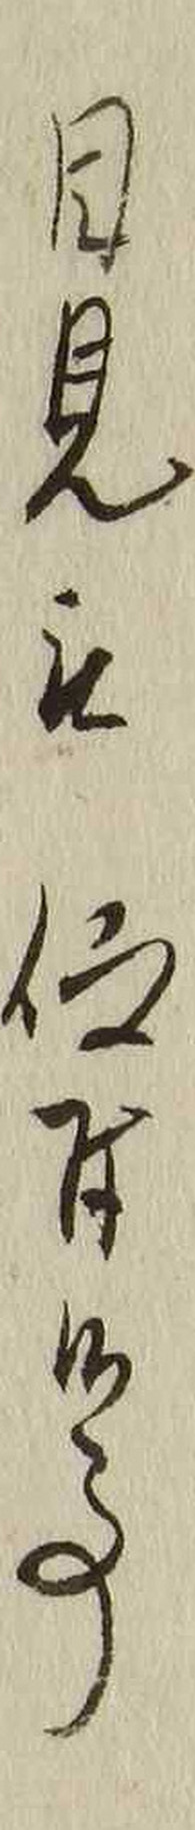目見被仰付候事
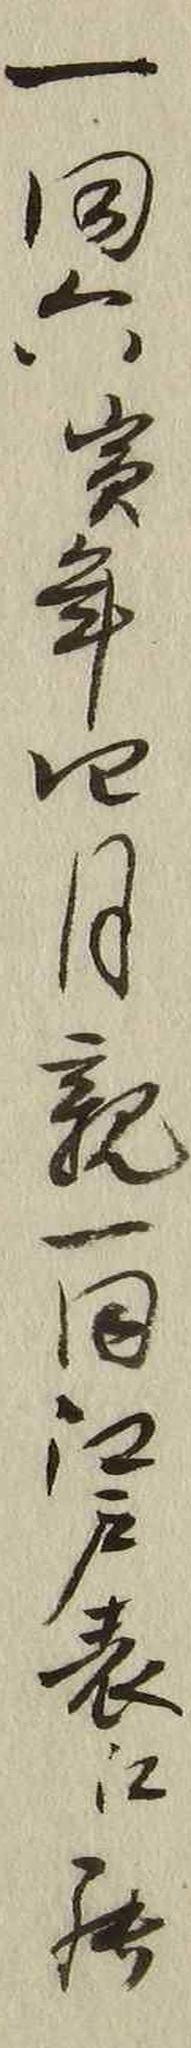一同六寅年四月親一同江戸表江罷
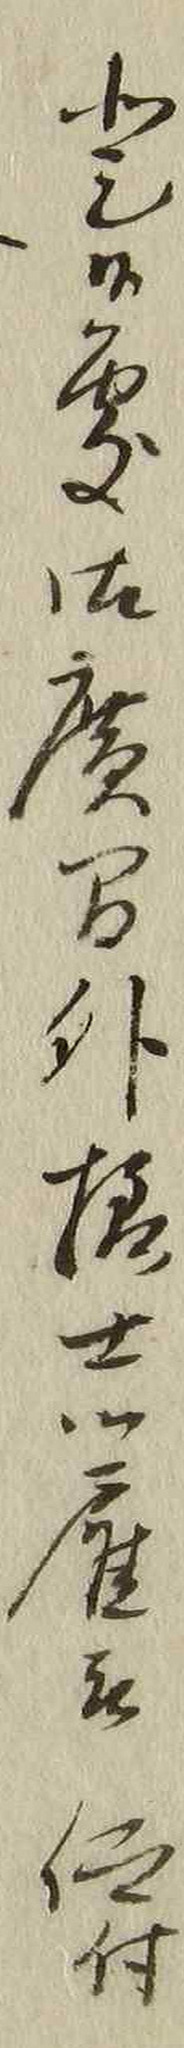登候処御広間外様士御雇被仰付
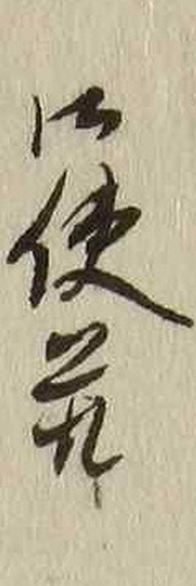御使并
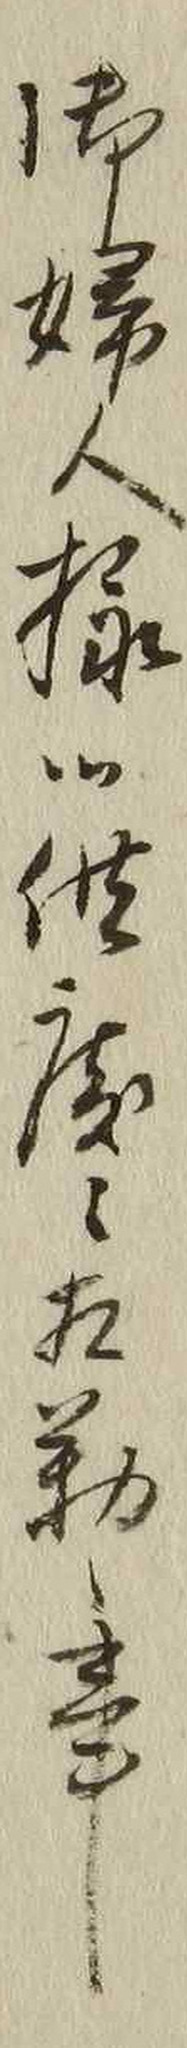御婦人様御供度々相勤候事
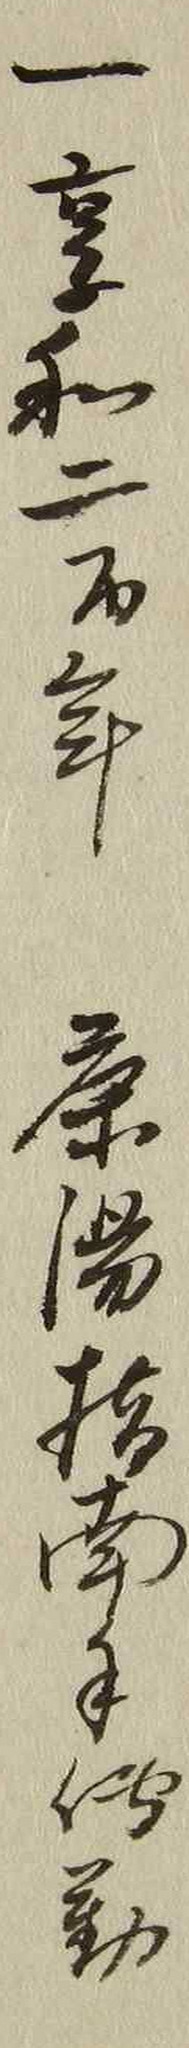一享和二酉年茶湯指南手伝勤
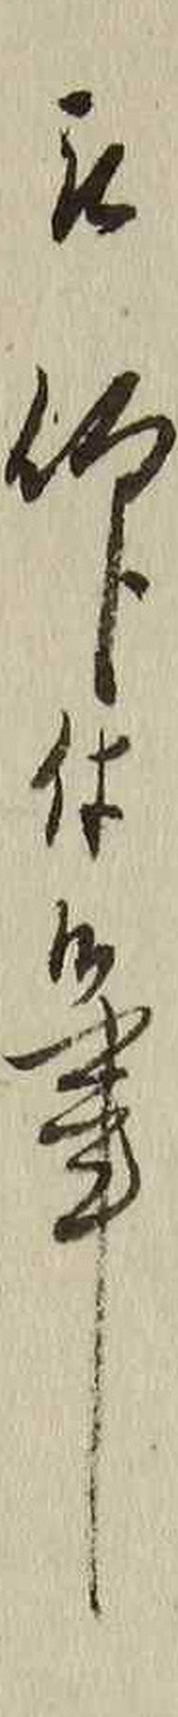被仰付候事
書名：諸士系譜　巻之359　す之部9
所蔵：会津若松市立会津図書館
